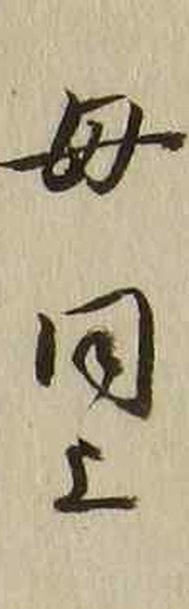母同上
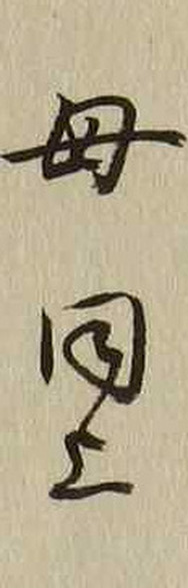母同上
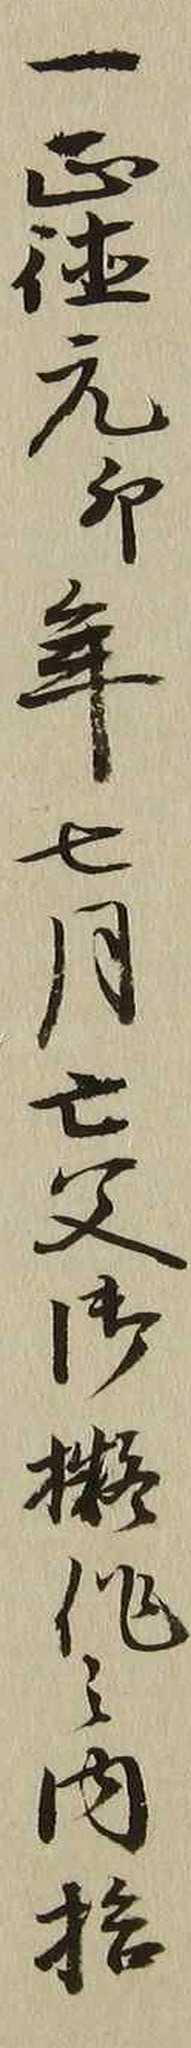一正徳元卯年七月亡父御擬作之内拾
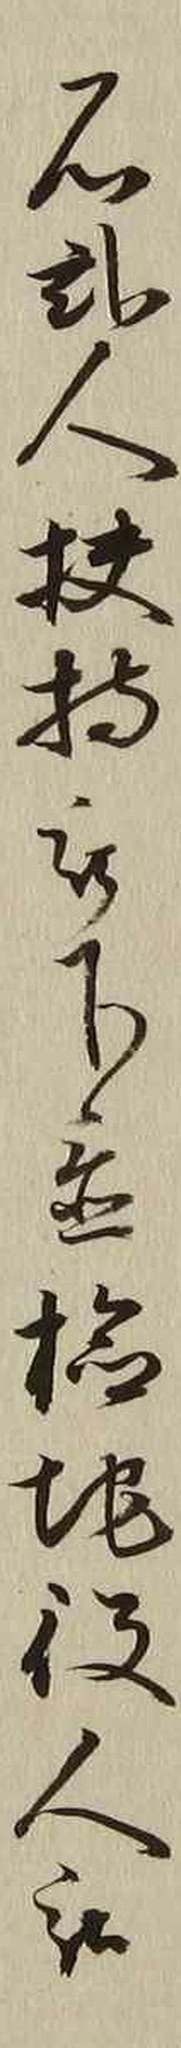石弐人扶持被下置検地役人被
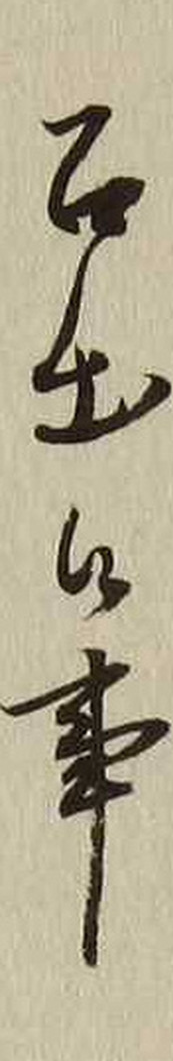召出候事
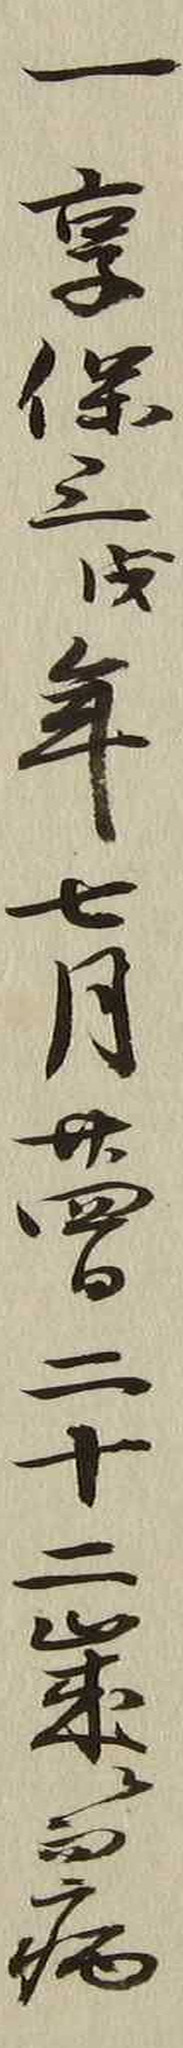一享保三戌年七月廿四日二十二歳ニ而病
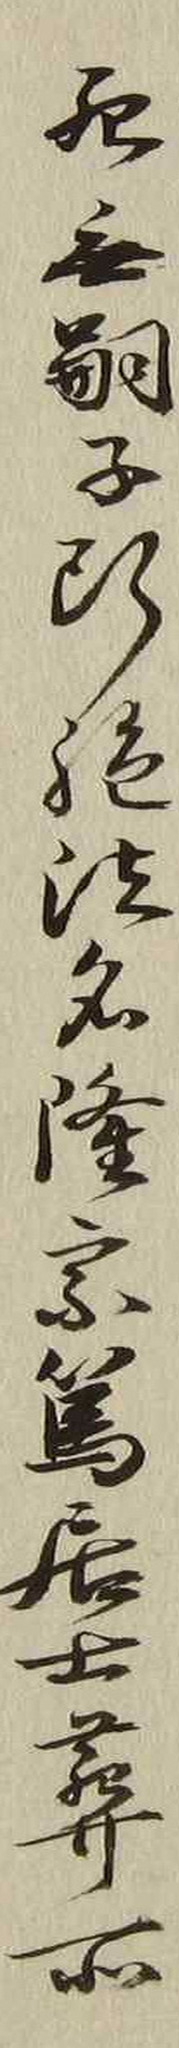死無嗣子断絶法名隆宗篤居士葬所
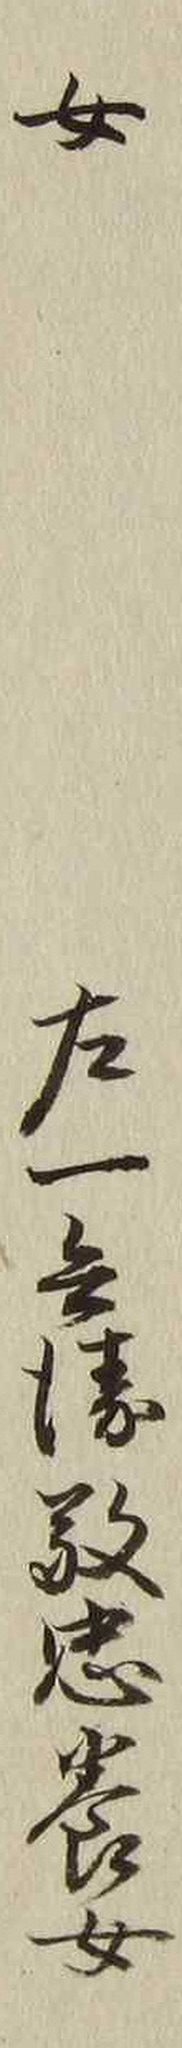女左一兵衛敬忠養女
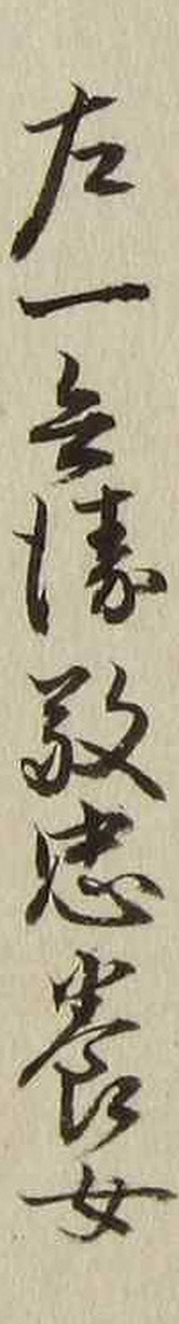女左一兵衛敬忠養女
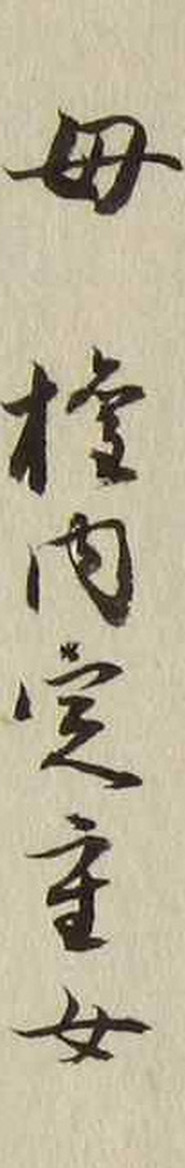母権内定重女
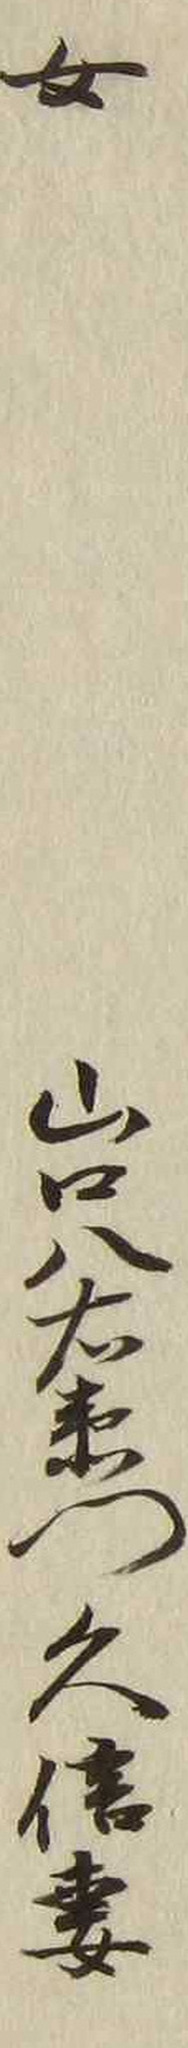女山口八右衛門久信妻
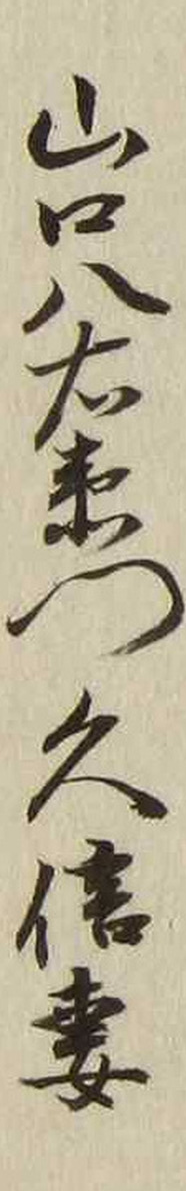女山口八右衛門久信妻

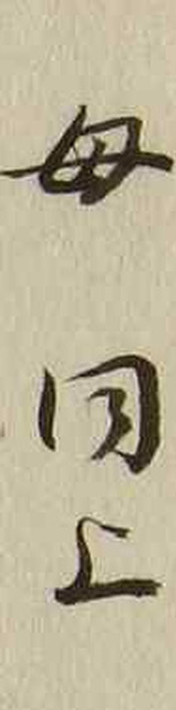母同上
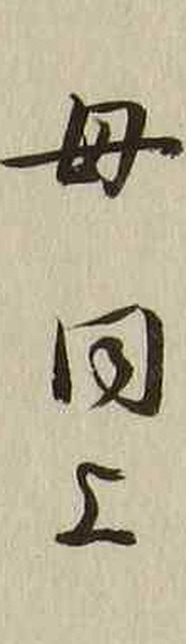母同上
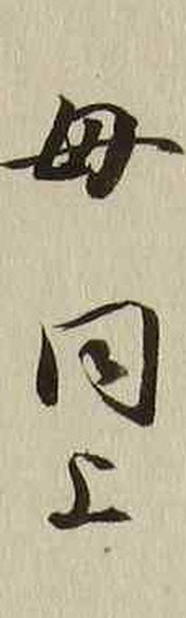母同上
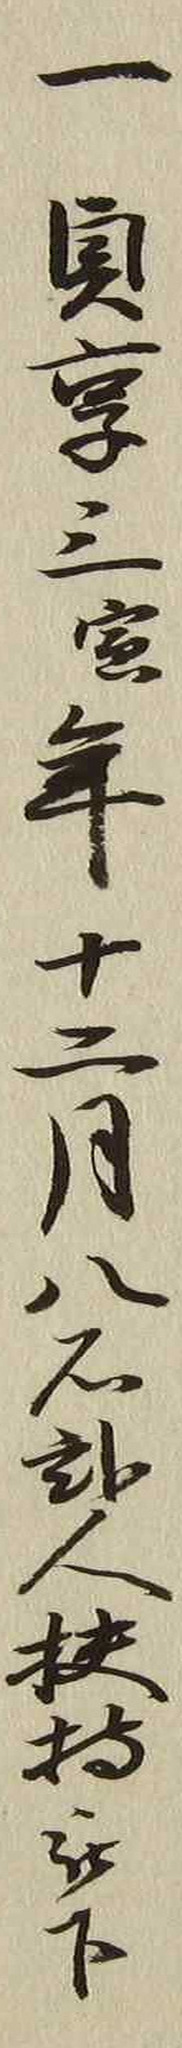一貞享三寅年十ニ月八石弐人扶持被下
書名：諸士系譜　巻之61　と之部4
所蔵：会津若松市立会津図書館
